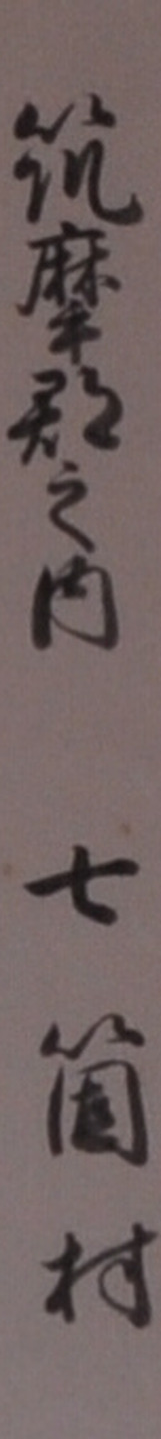筑摩郡之内七箇村
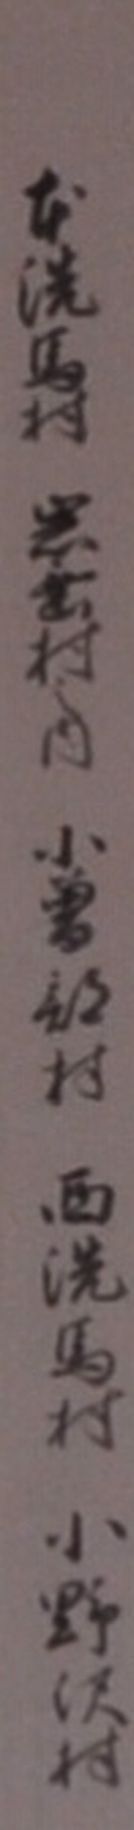本洗馬村岩垂村之内小曽部村西洗馬村小野沢村
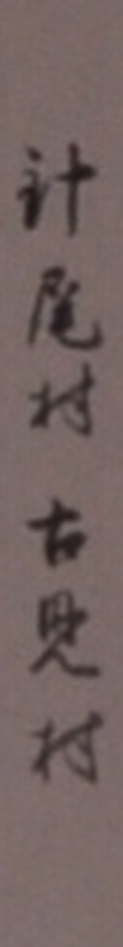針尾村古見村
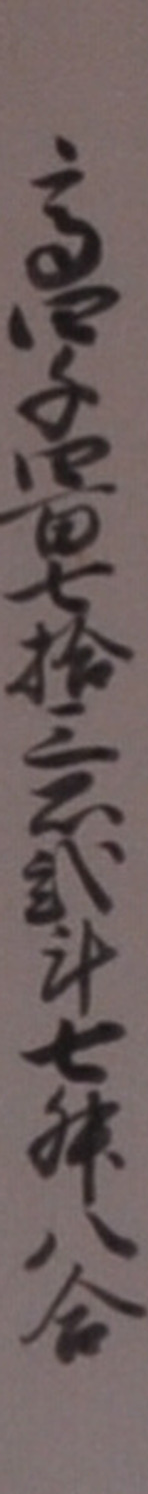高四千四百七拾三石弐斗七升八合
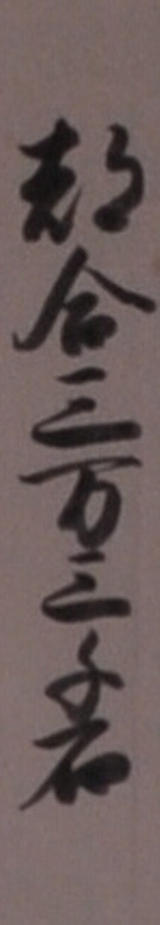都合三万三千石
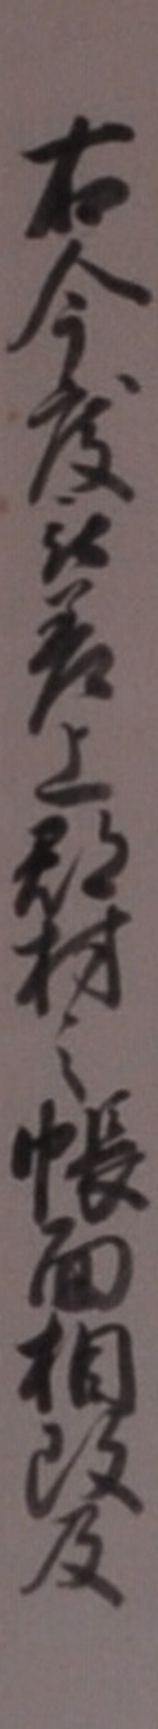右今度被差上郡村之帳面相改及
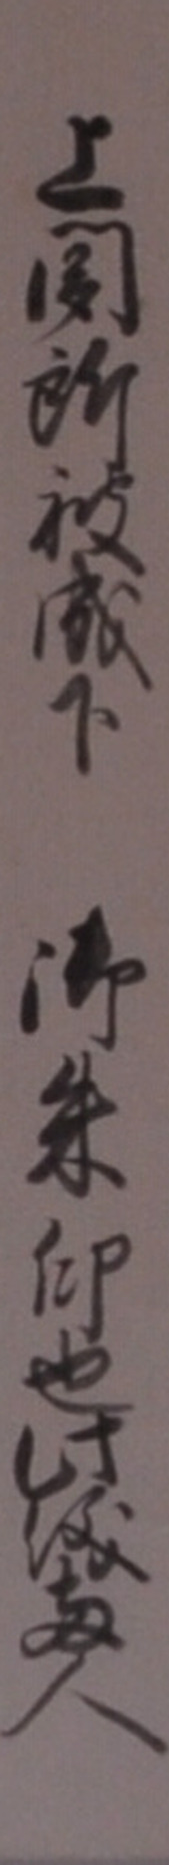上聞所被成下御朱印也此儀両人
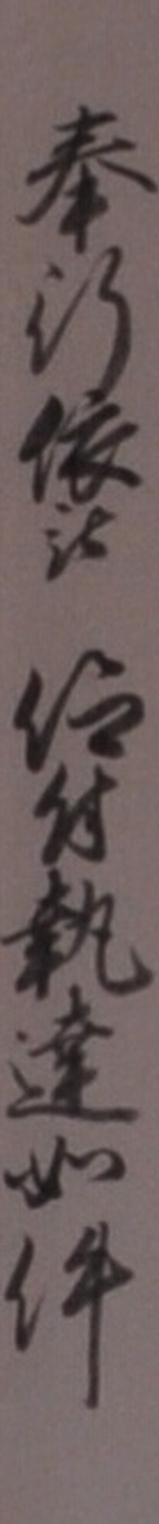奉行依被仰付執達如件
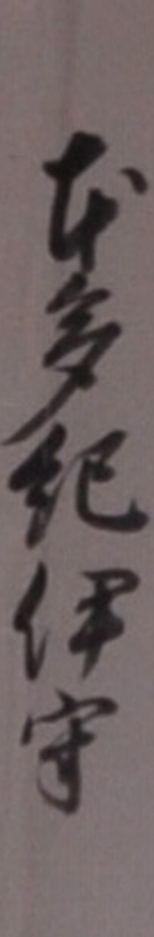本多紀伊守
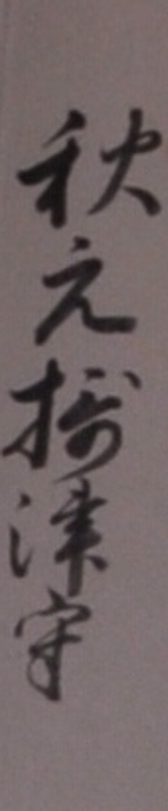秋元摂津守
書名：御朱印写・領地目録写
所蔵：伊那市立高遠町図書館・合同会社AMANE
